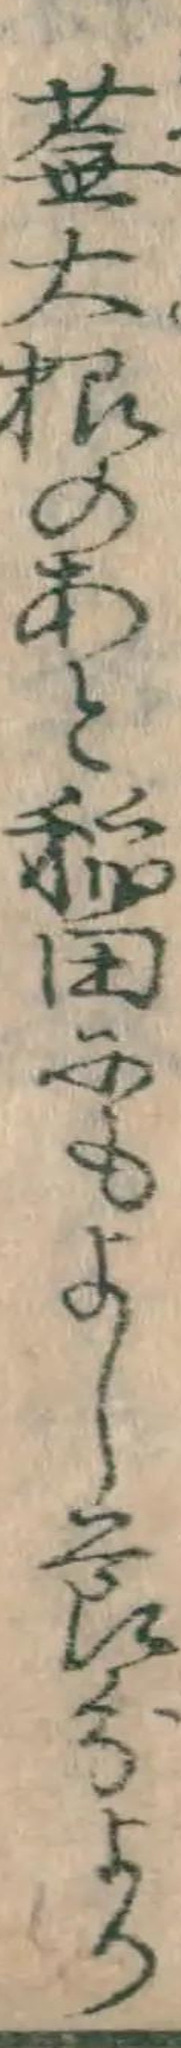一藍蕪大根のあと稲田にもよし節分より
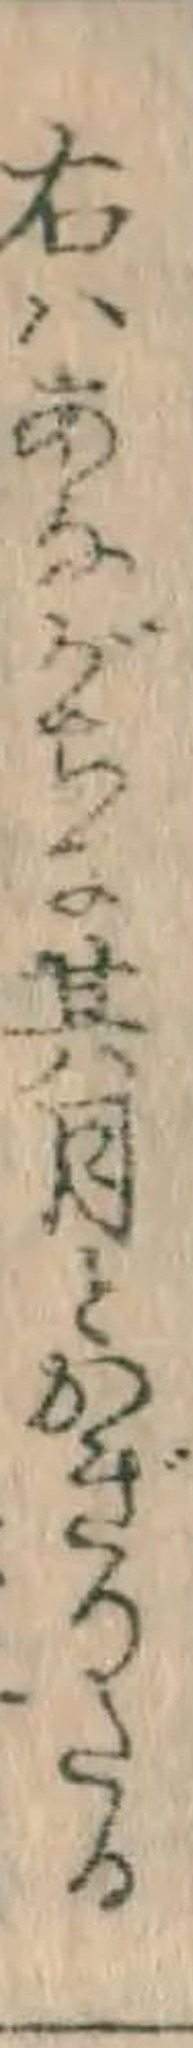右はあながちに其月とかぎりたる
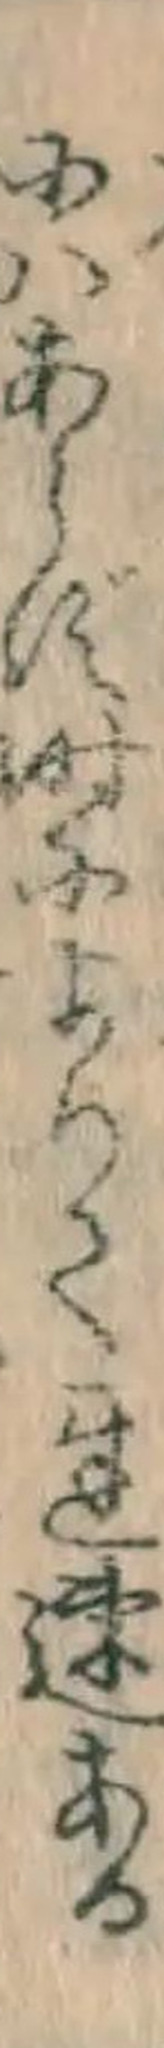にはあらず時によりて遅速ある
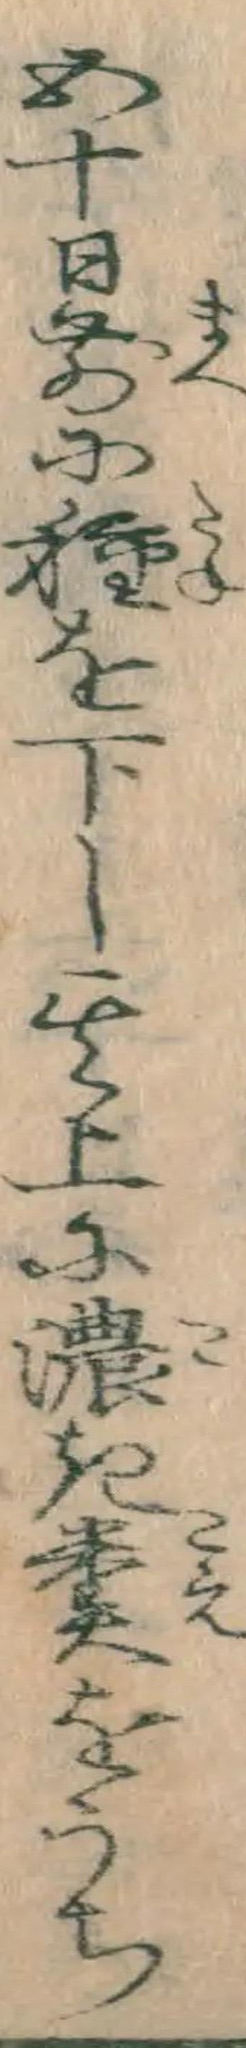五十日前に種を下し其上に濃き糞をうち
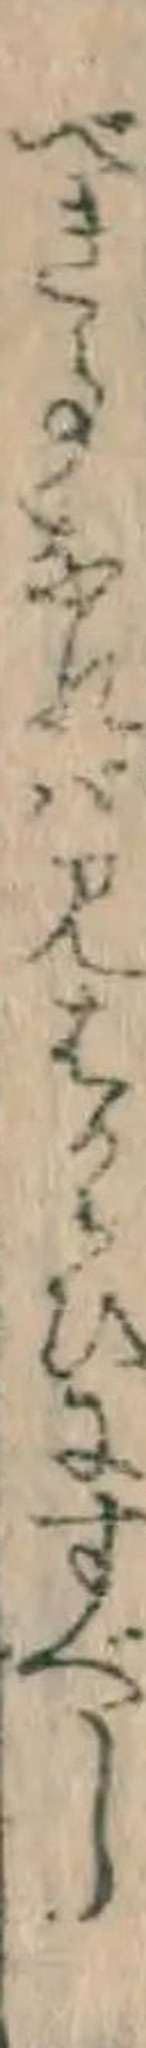べき事なれば見はからひにすべし
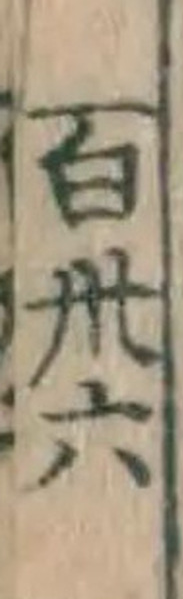百卅六

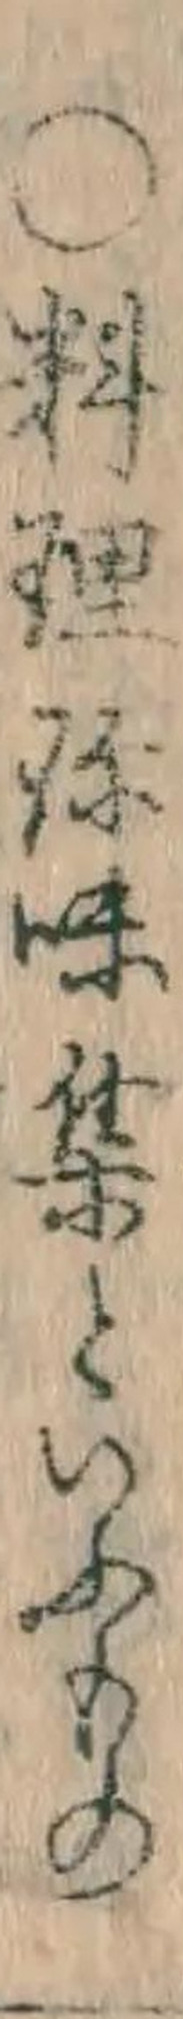◦料理珍味集といふもの
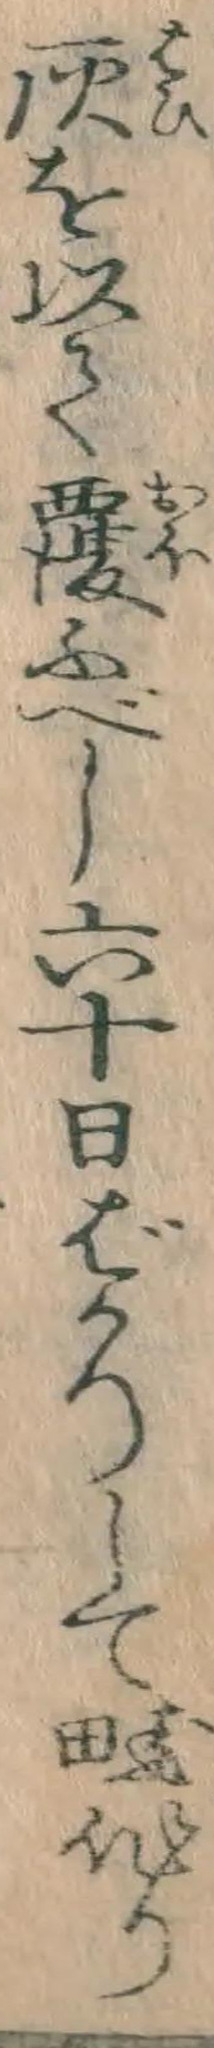灰を以て覆ふべし六十日ばかりして畦作り
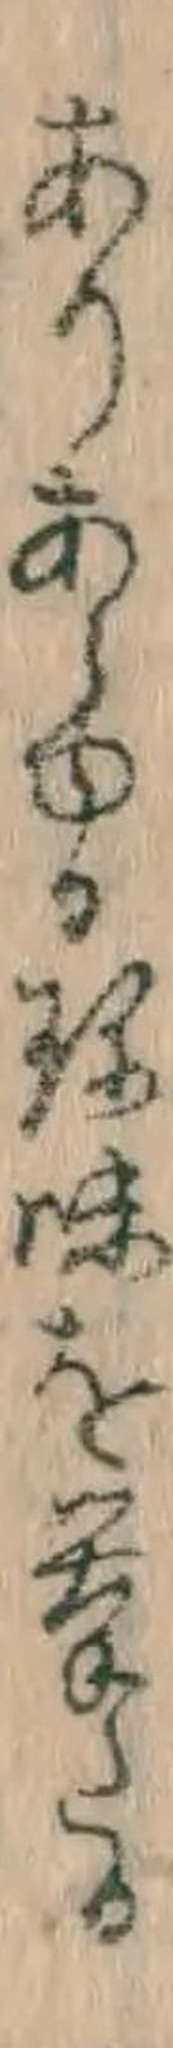ありあらゆる珍味を挙たる
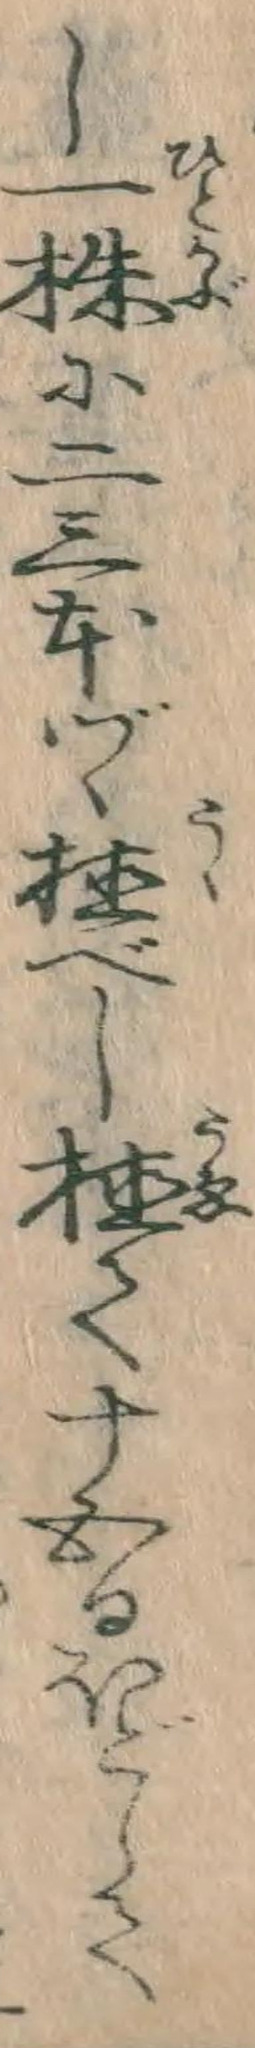し一株に二三本づゝ植べし植て十五日ほどして
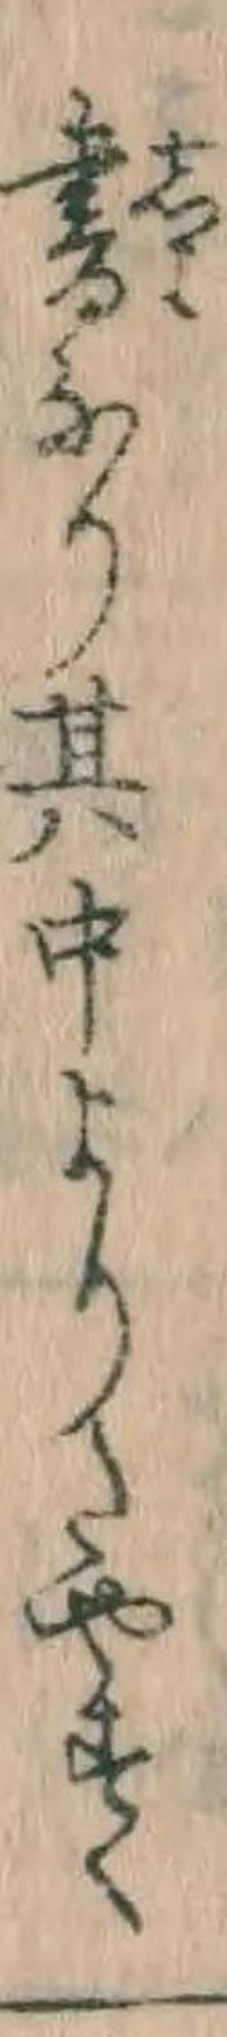書なり其中よりたやすく
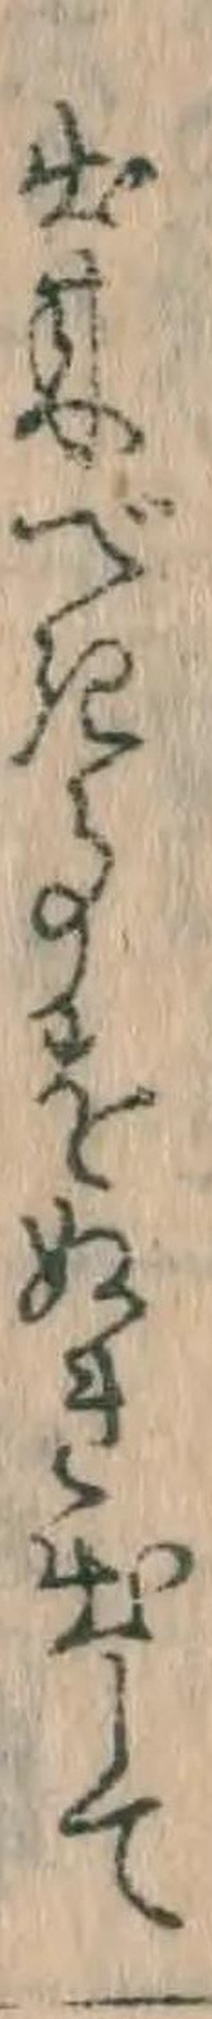出来べき事をぬき出して
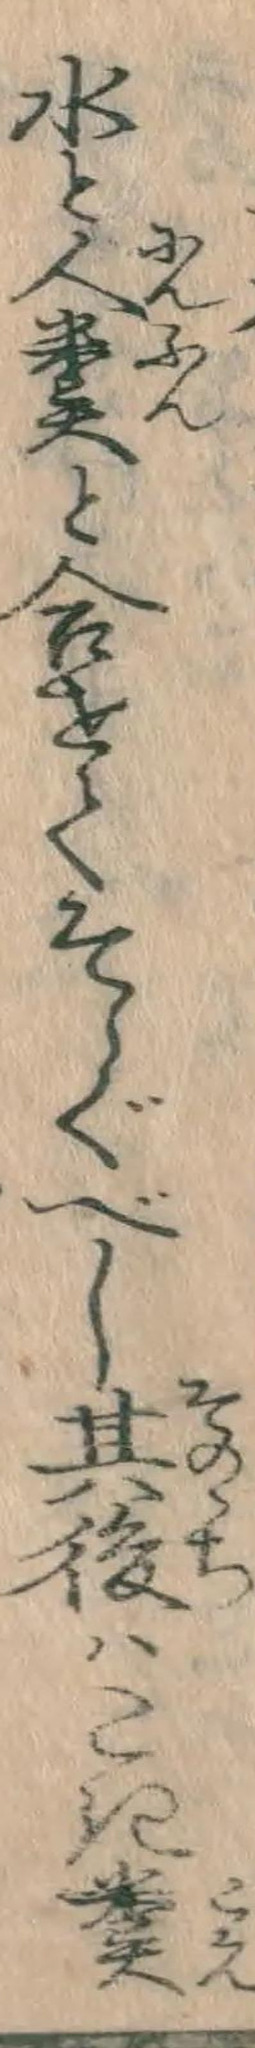水と人糞と合せてそゝぐべし其後はこき糞
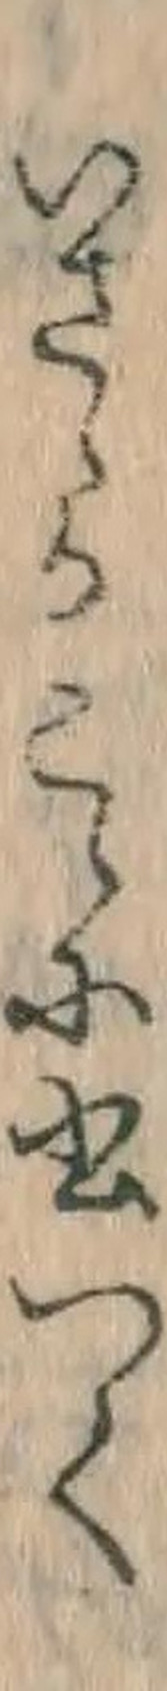いさゝかこゝに書つく
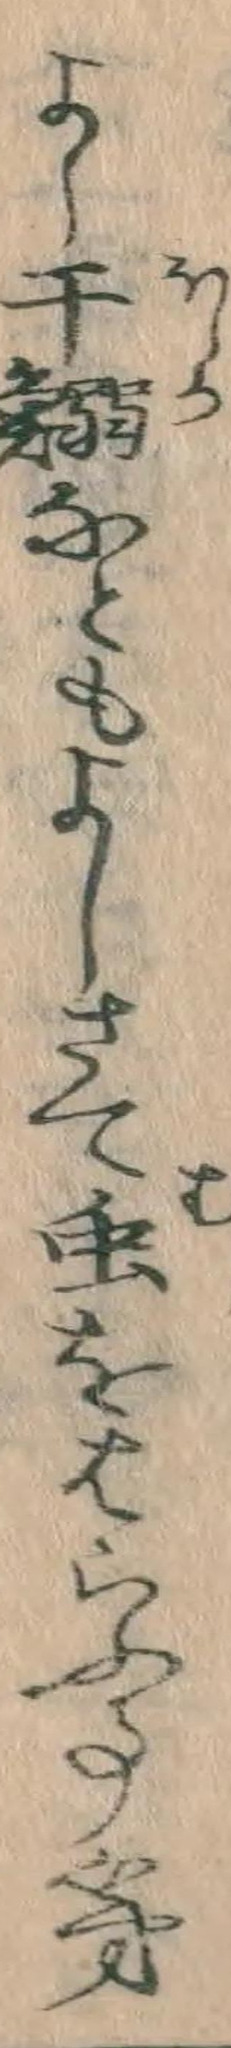よし干鰯なともよしさて虫をはらふ事第
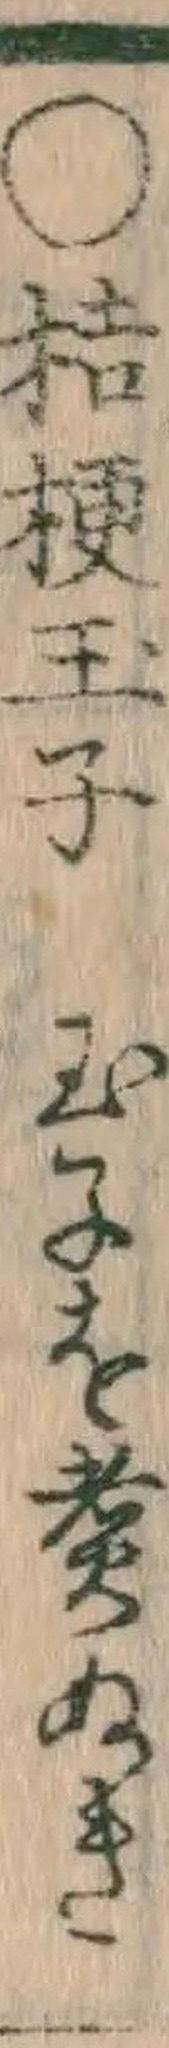○桔梗玉子玉子を煮ぬき
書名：広益秘事大全 3巻. [5]
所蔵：国立国会図書館 National Diet Library, JAPAN
